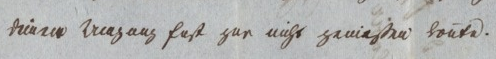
Deinen Umgang fast gar nicht genießen konnte.
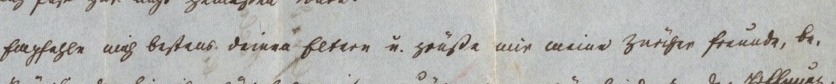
Empfehle mich bestens Deinen Eltern u. grüße mir meine Zürcher Freunde, be-
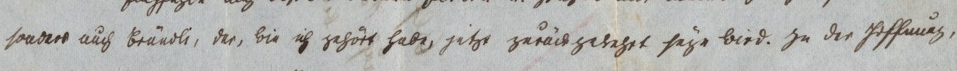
sonders auch Brändli, der, wie ich gehört habe, jetzt zurückgekehrt seyn wird. In der Hoffnung,
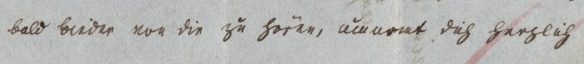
bald wieder von Dir zu hören, umarmt Dich herzlich
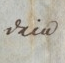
Dein
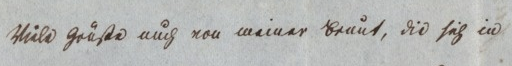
Viele Grüße auch von meiner Braut, die sich in
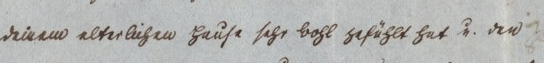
Deinem elterlichen Hause sehr wohl gefühlt hat u. den
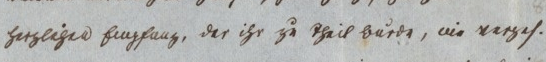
herzlichen Empfang, der ihr zu Theil wurde, nie verges-
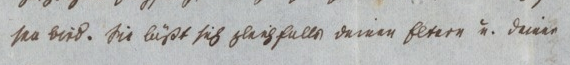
sen wird. Sie läßt sich gleichfalls Deinen Eltern u. Deiner
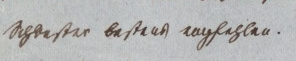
Schwester bestens empfehlen.
